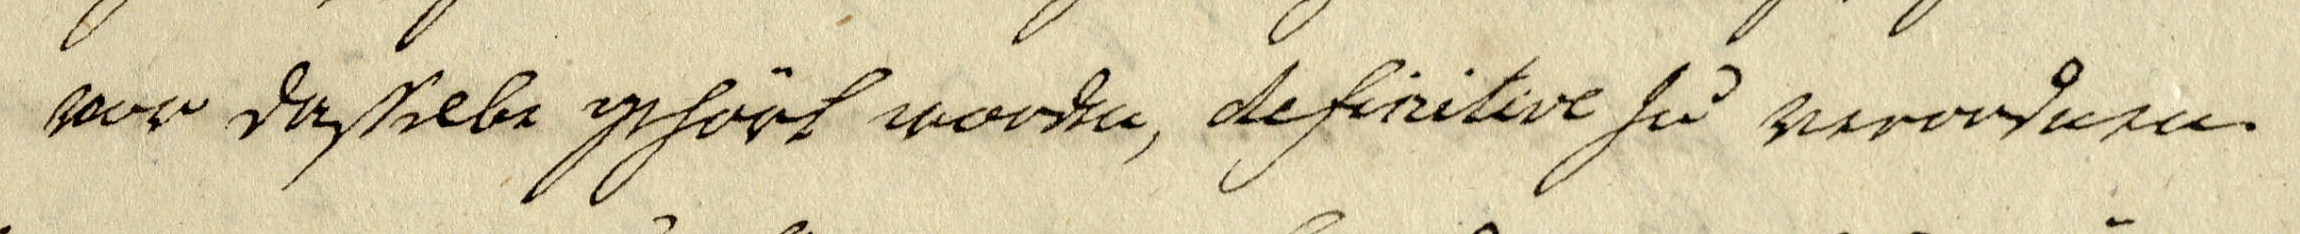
vor dasselbe gehört worden, definitive zu verordnen.
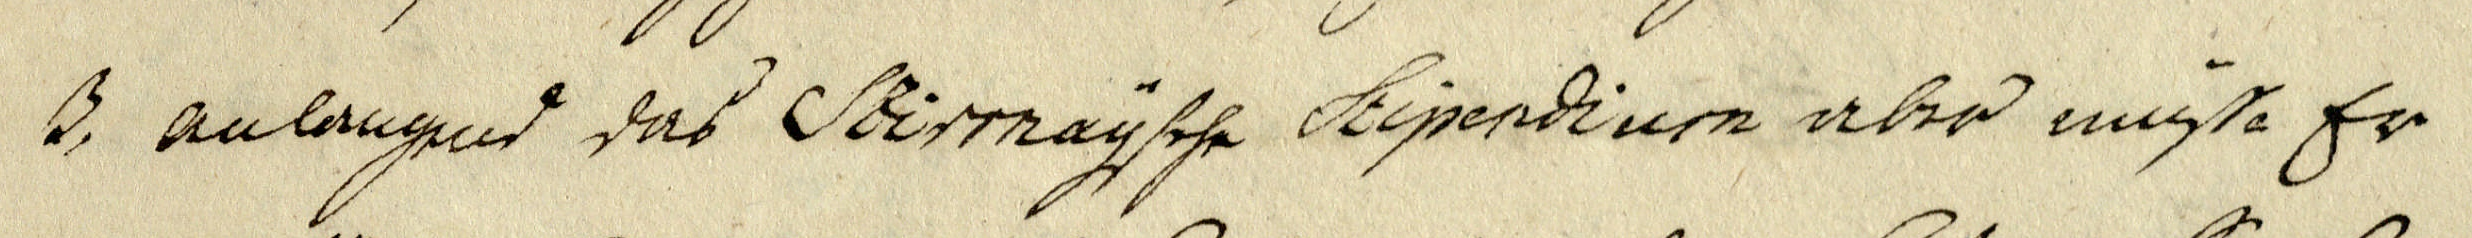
3. Anlangend das Szirmaÿsche Stipendium aber müsse Er
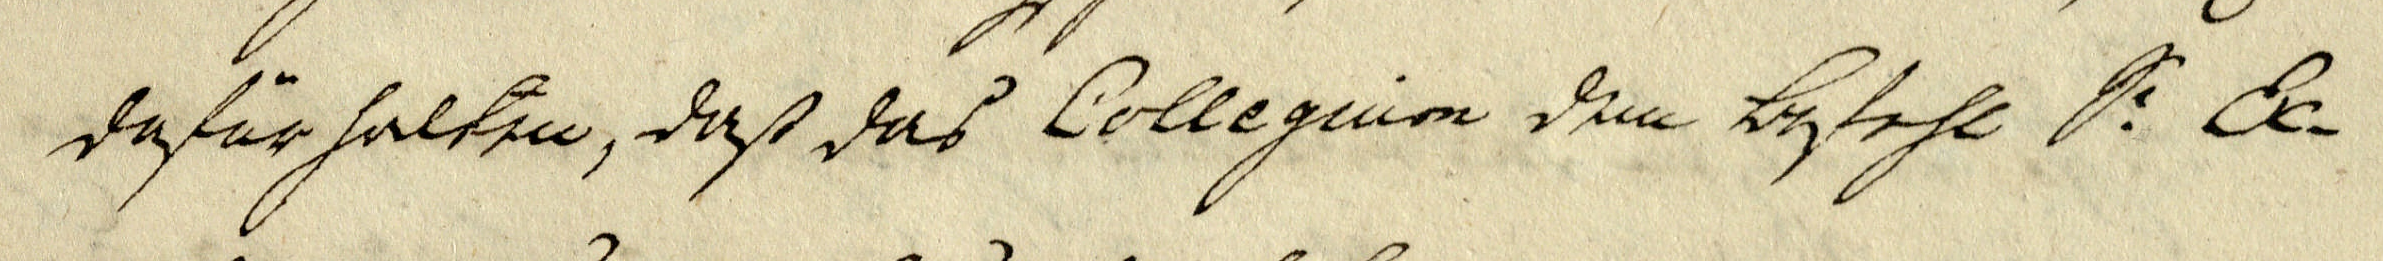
dafürhalten, daß das Collegium dem Befehl S. Ex¬
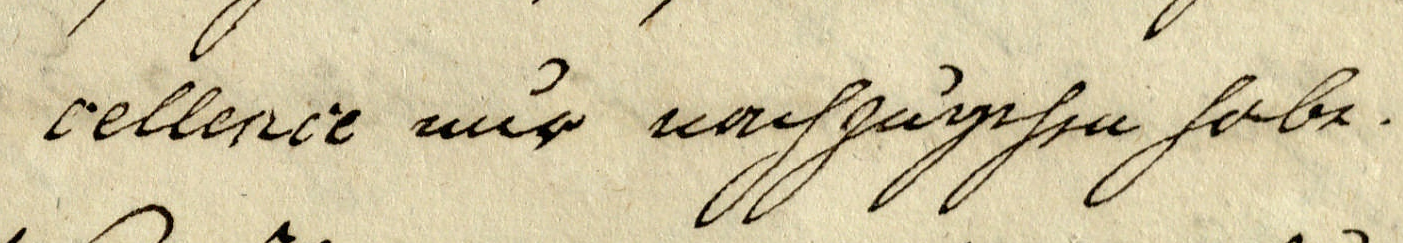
cellence nur nachzugehen habe.
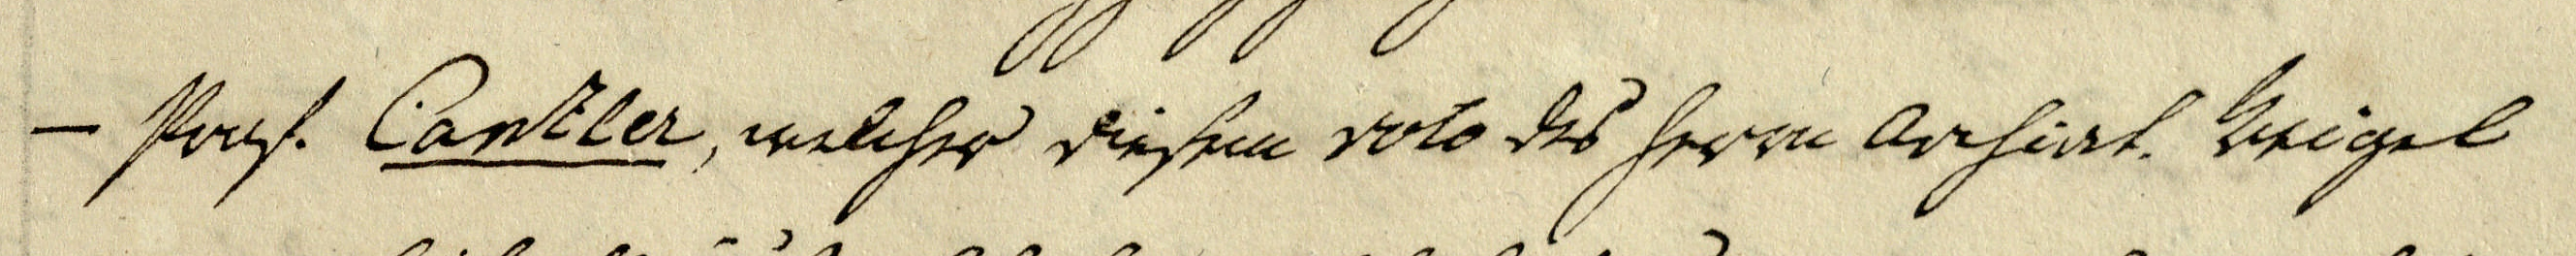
Prof. Canzler, welcher diesem voto des Herrn Archiat. Weigel
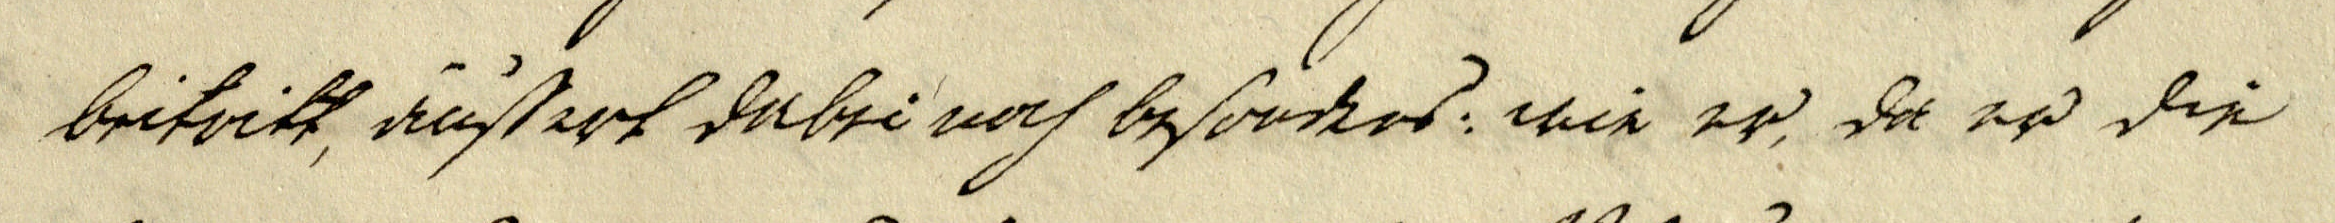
beitritt äussert dabei noch besonders: wie er, da er die
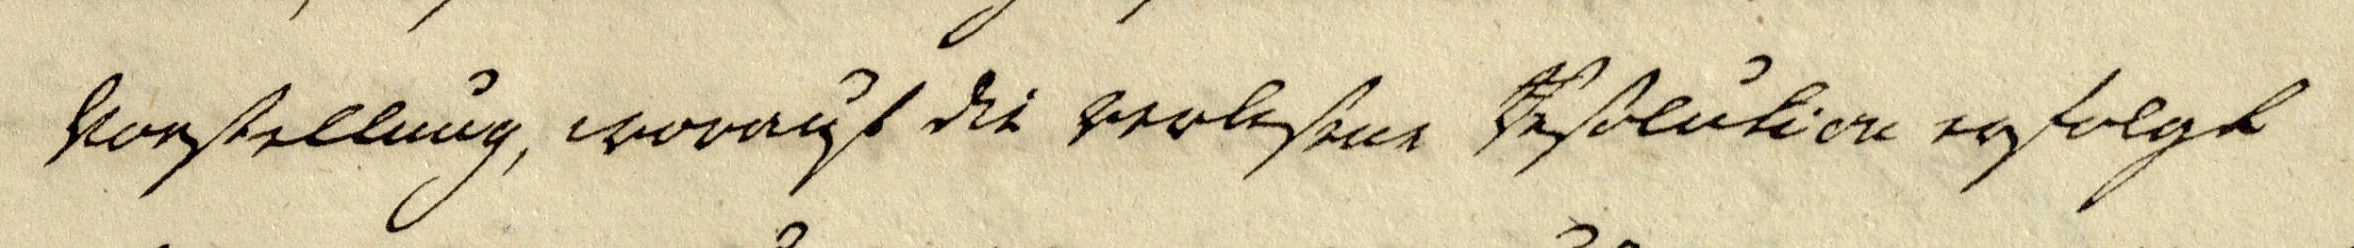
Vorstellung, worauf die verlesene Resolution erfolgt
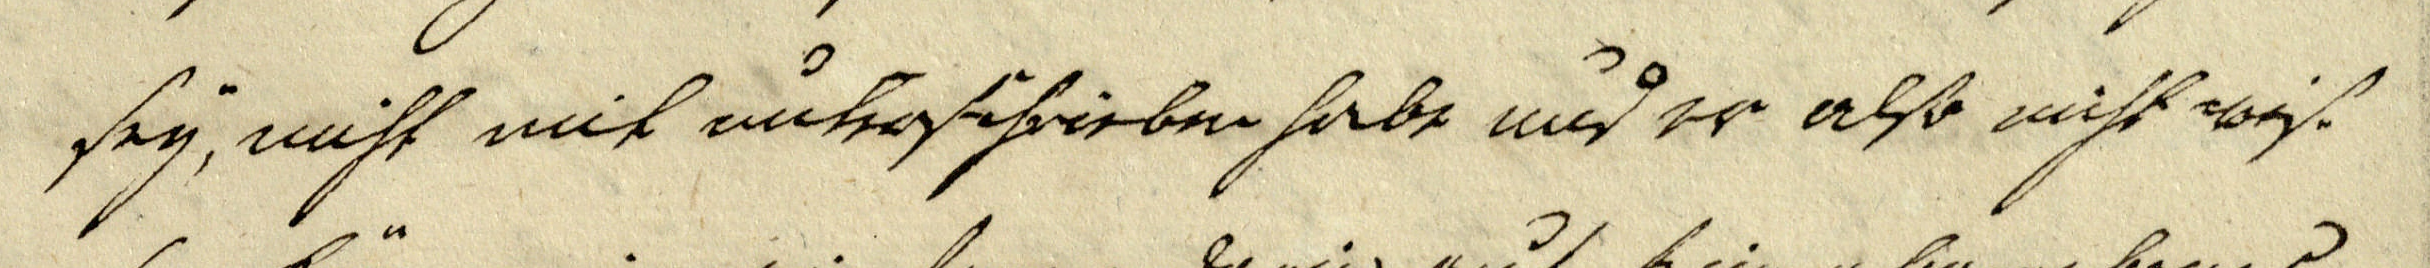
seÿ, nicht mit unterschrieben habe und er also nicht wis¬
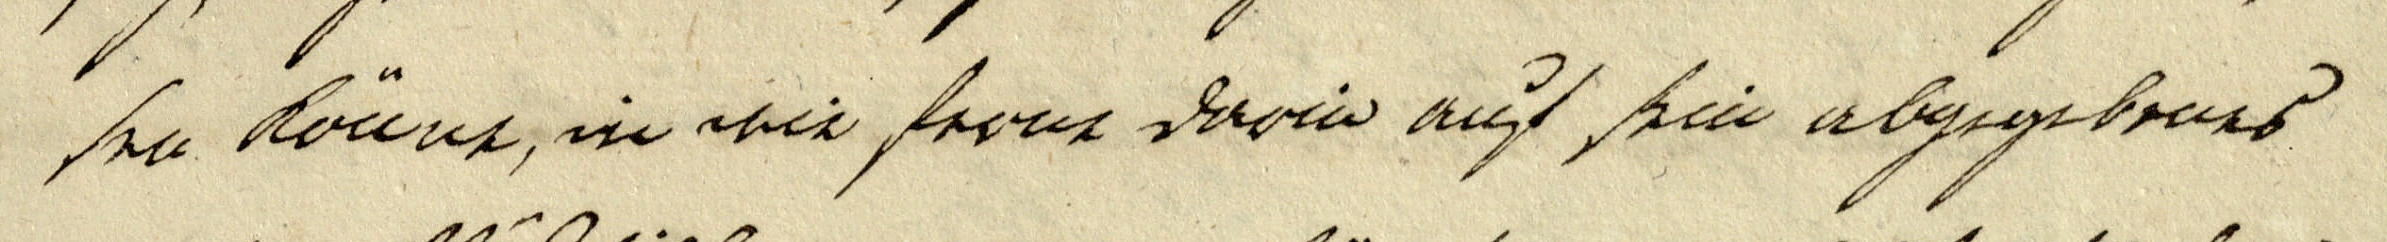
sen könne, in wie ferne darin auf sein abgegebenes
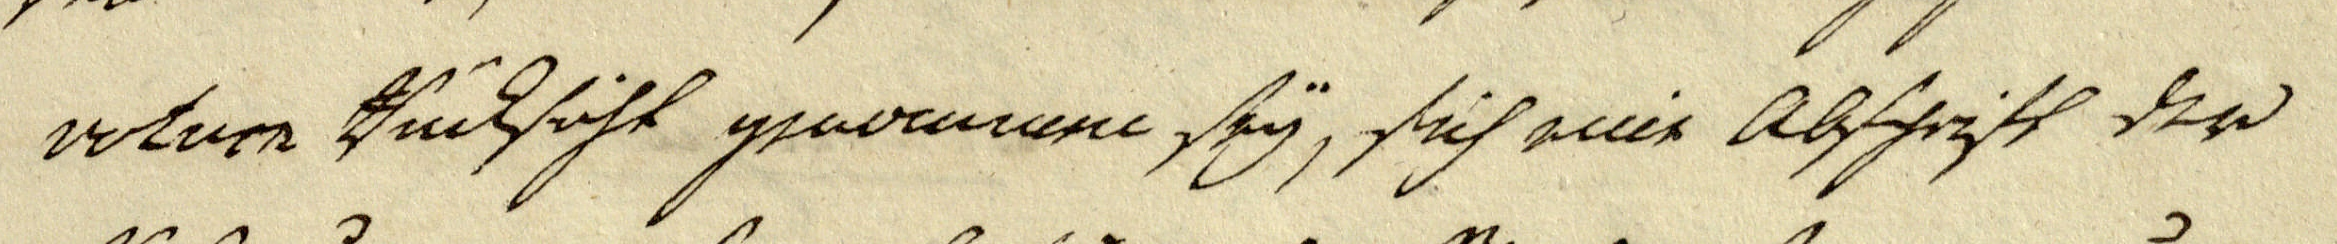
votum Rücksicht genommen seÿ, sich eine Abschrift der
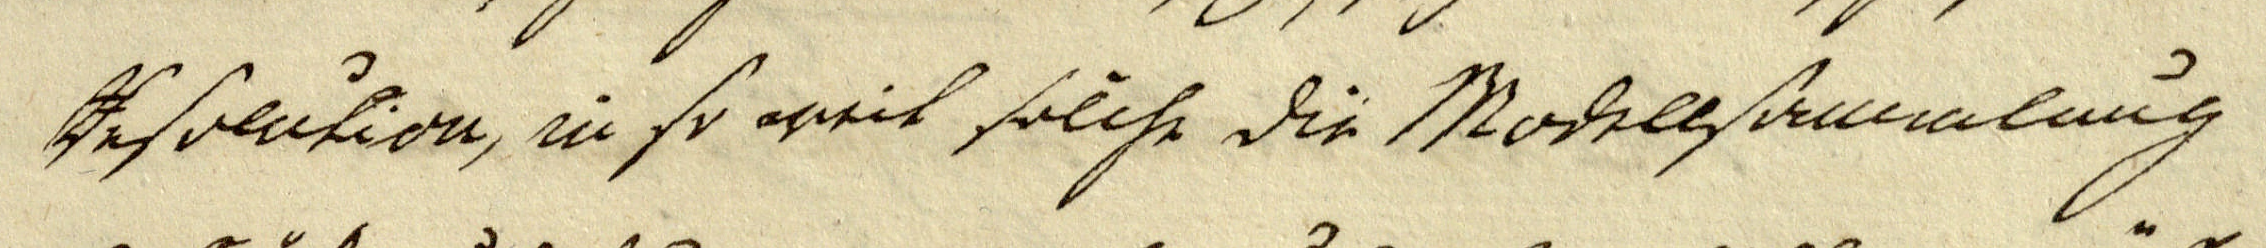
Resolution, in so weit solche die Modellsammmlung
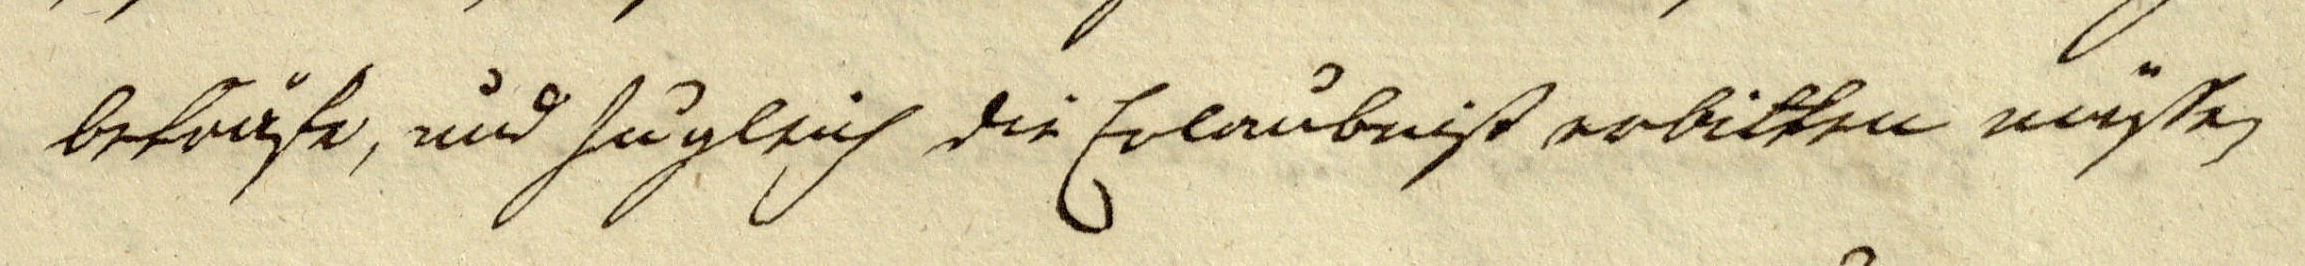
beträfe, und zugleich die Erlaubniß erbitten müsse,
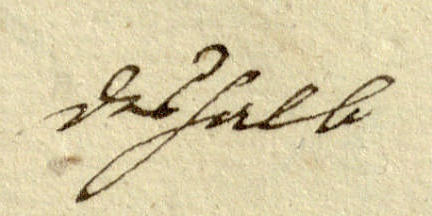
deshalb
